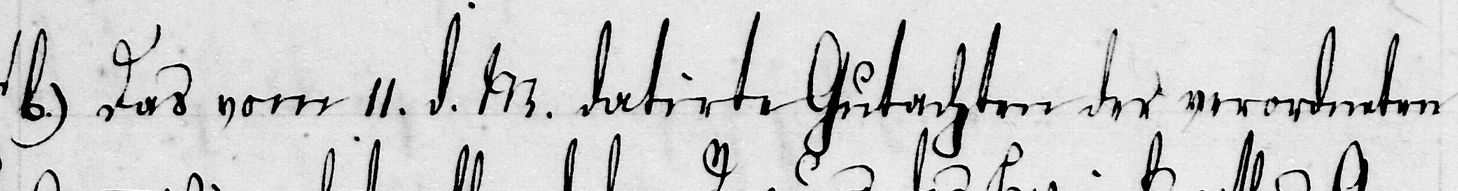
b.) Das vom 11. d. M. datirte Gutachten der verordneten
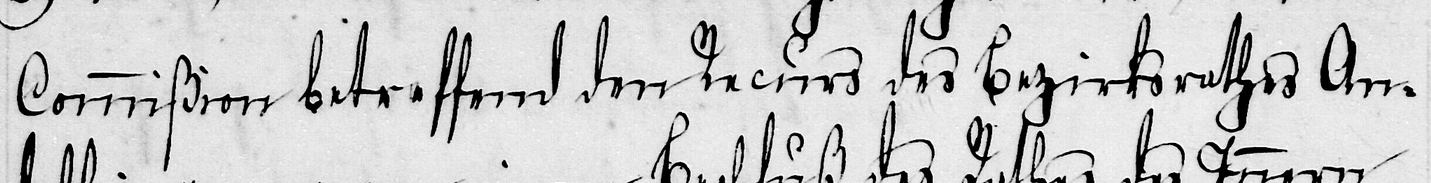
Commißion betreffend den Recurs des Bezirksrathes An¬
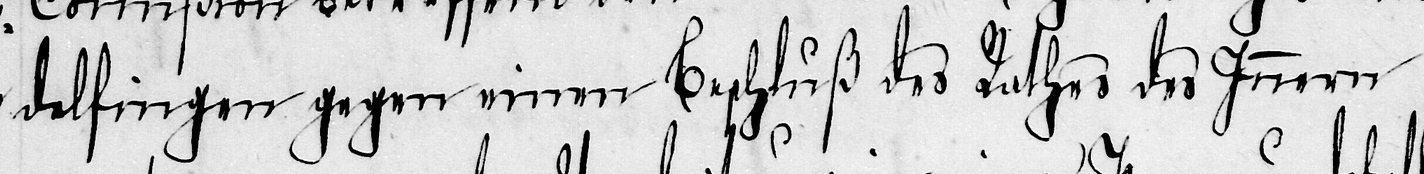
delfingen gegen einen Beschluß des Rathes des Innern
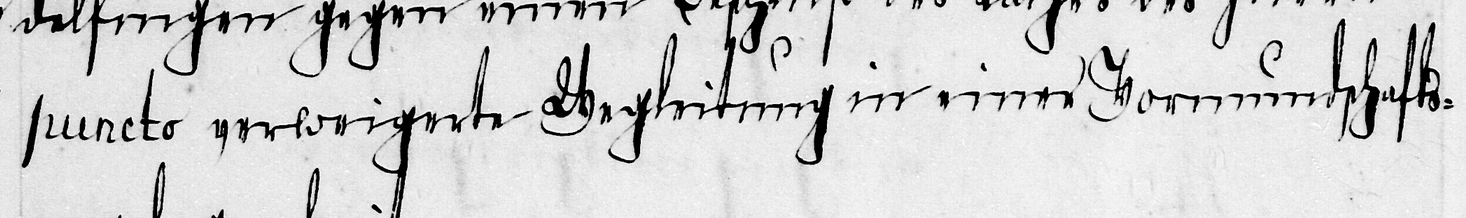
puncto verweigerte Wegleitung in einer Vormundschafts¬
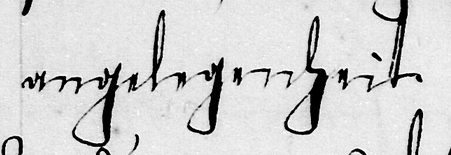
angelegenheit.
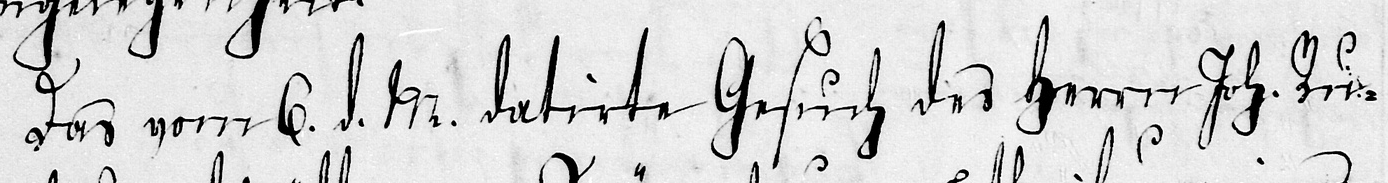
Das vom 6. d. M. datirte Gesuch des Herrn Joh. Ru¬
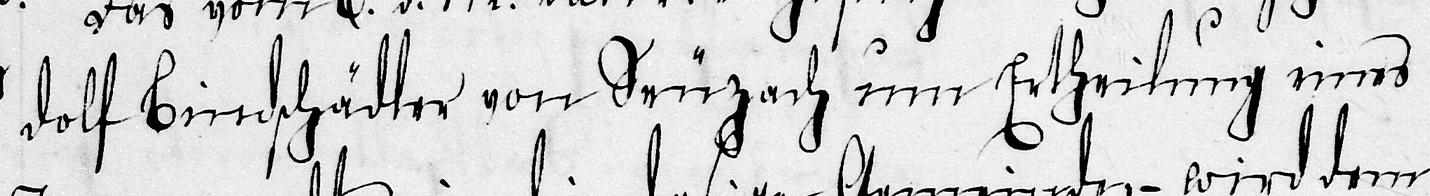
dolf Bindschädler von Seuzach um Ertheilung eines
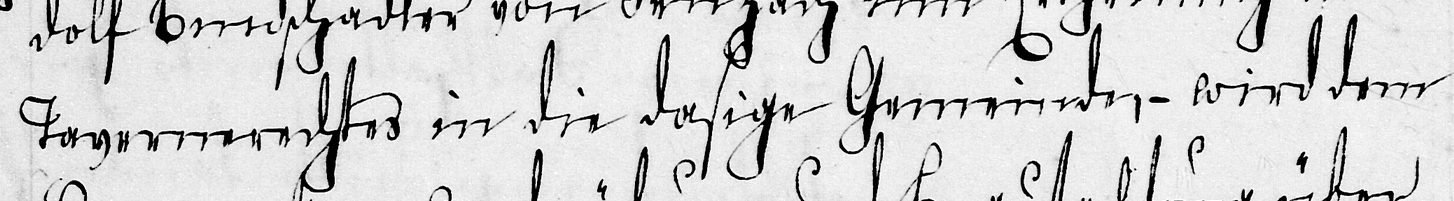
Tavernerechtes in die dasige Gemeinde, – wird dem
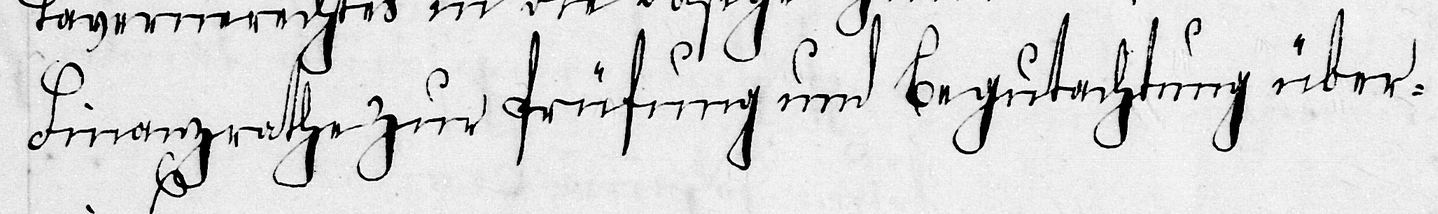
Finanzrathe zur Prüfung und Begutachtung über¬
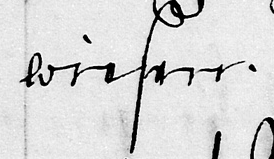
wiesen.
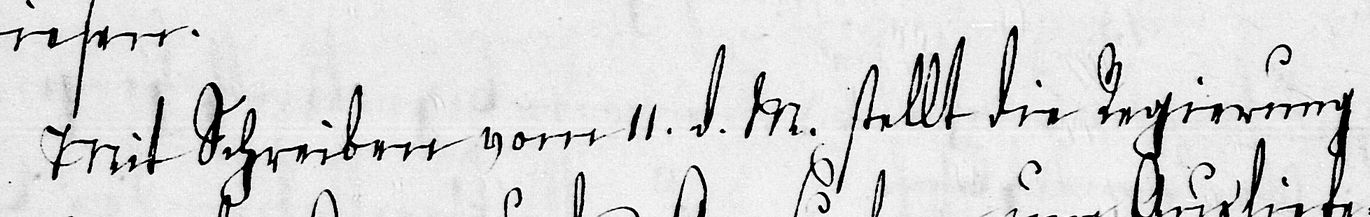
Mit Schreiben vom 11. d. M. stellt die Regierung
